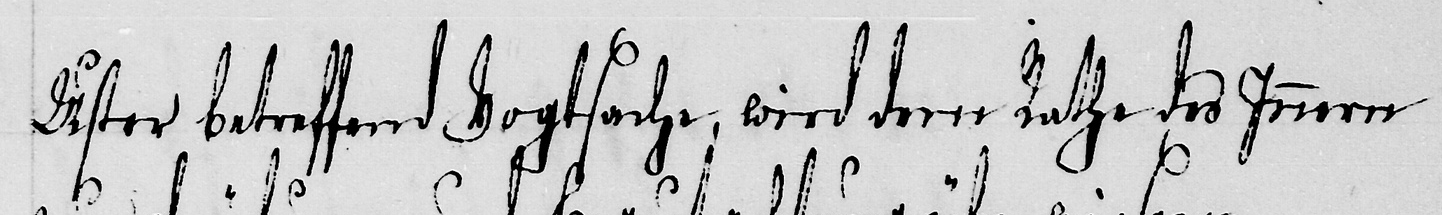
betreffend Vogtsache, wird dem Rathe des Innern
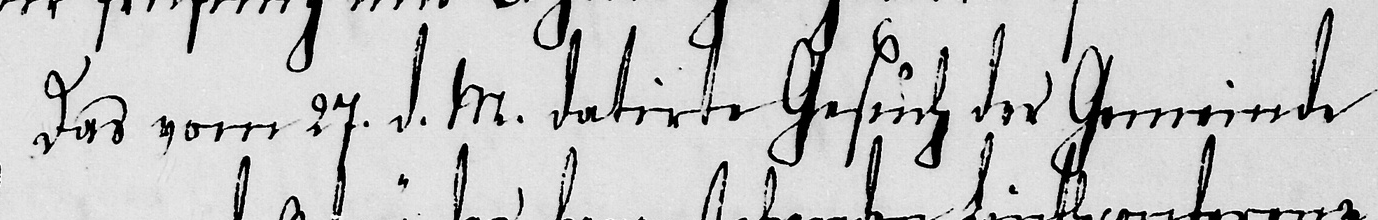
Das vom 27. d. M. datirte Gesuch der Gemeinde
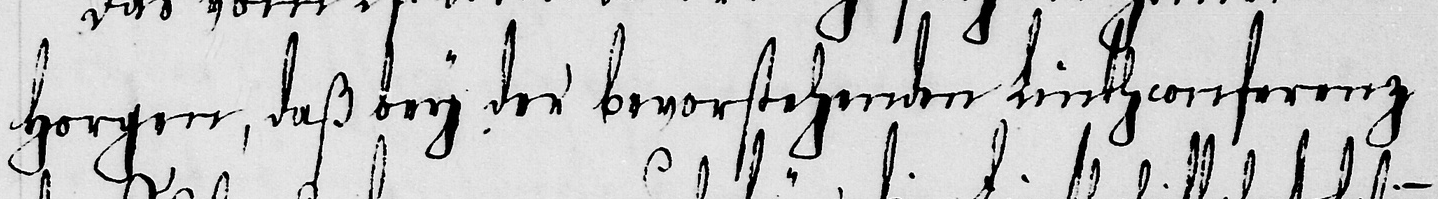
Horgen, daß bey der bevorstehenden Linthconferenz
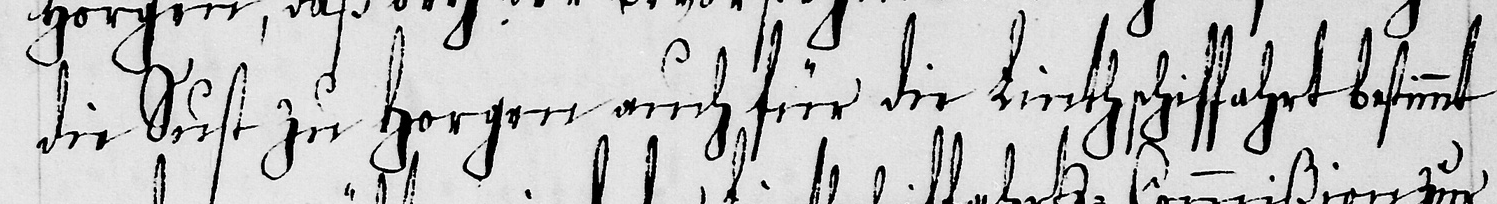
die Sust zu Horgen auch für die Linthschiffahrt
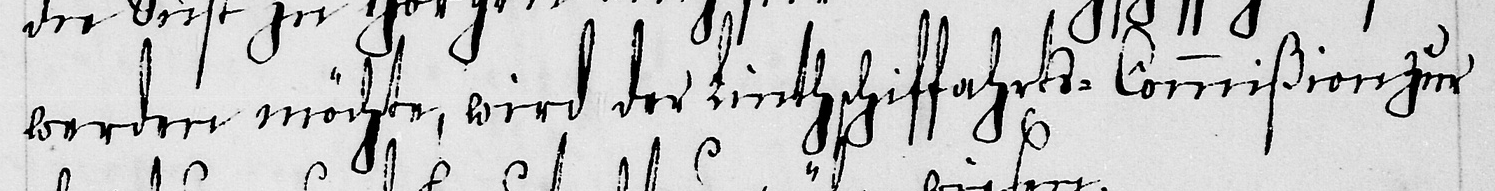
werden möchte, wird der Linthschiffahrts-Commißion zur
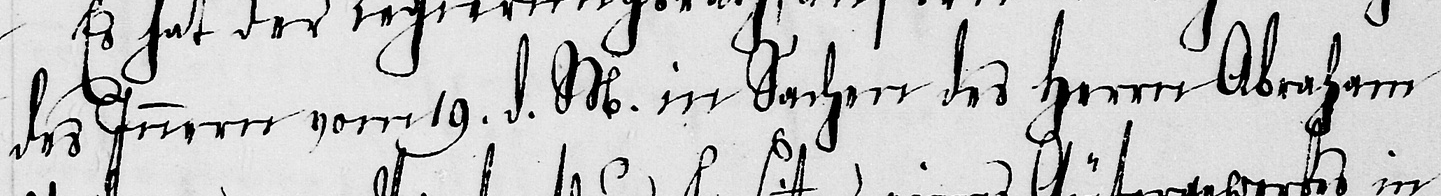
des Innern vom 19. d. M. in Sachen des Herrn Abraham
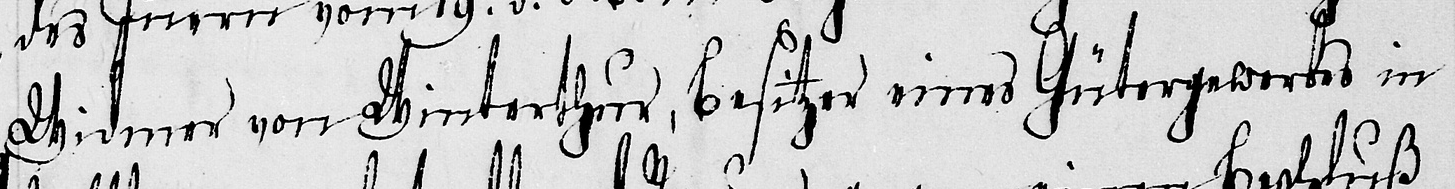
Widmer von Winterthur, Besitzer eines Gütergewerbes in
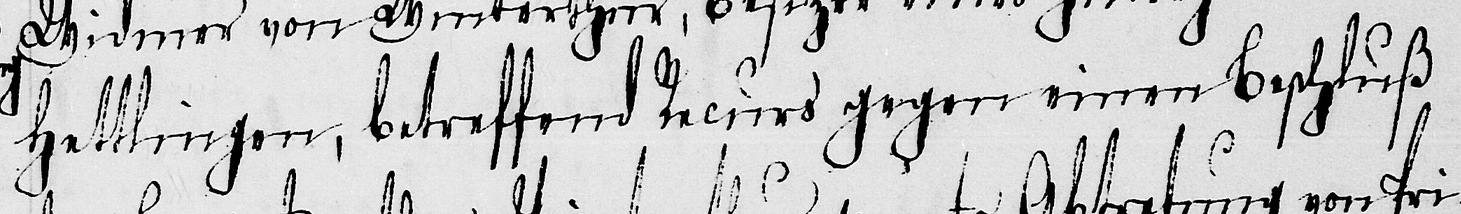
Hettlingen, betreffend Recurs gegen einen Beschluß
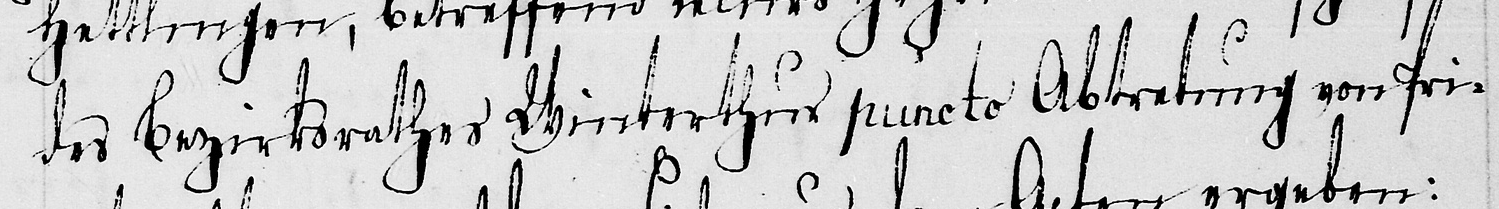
des Bezirksrathes Winterthur puncto Abretung von Pri¬
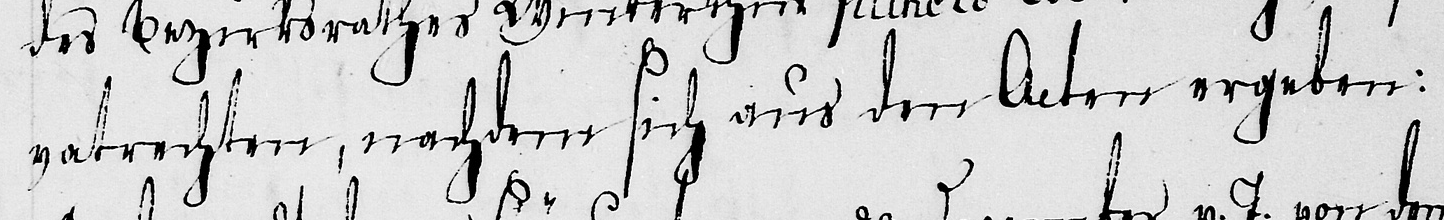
vatrechten, nachdem sich aus den Acten ergeben:
